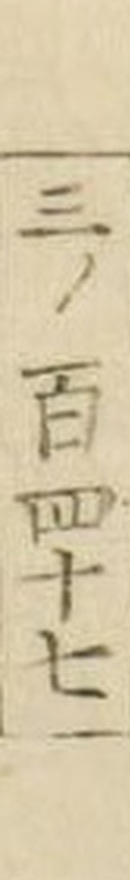三ノ百四十七
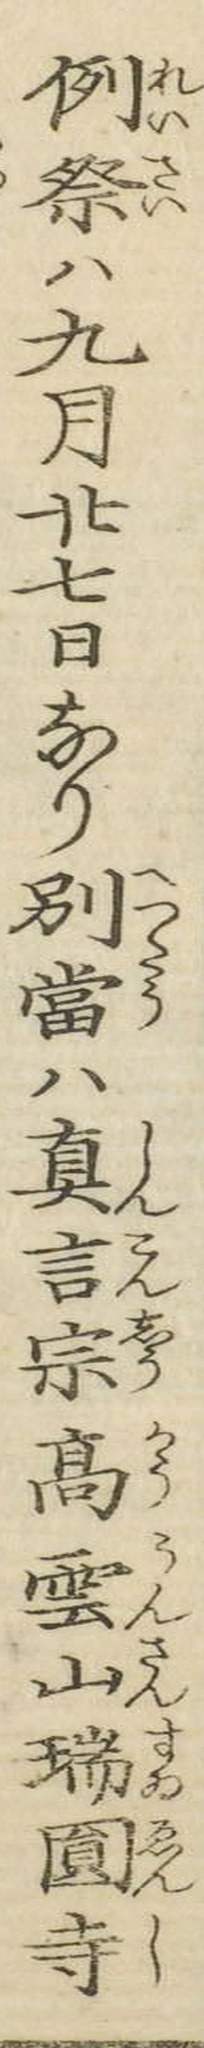例祭は九月廿七日なり別当は真言宗高雲山瑞円寺
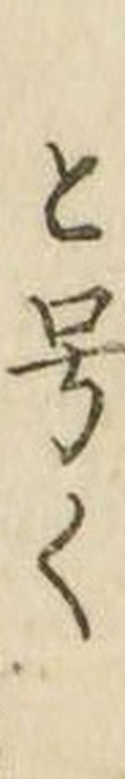と号く
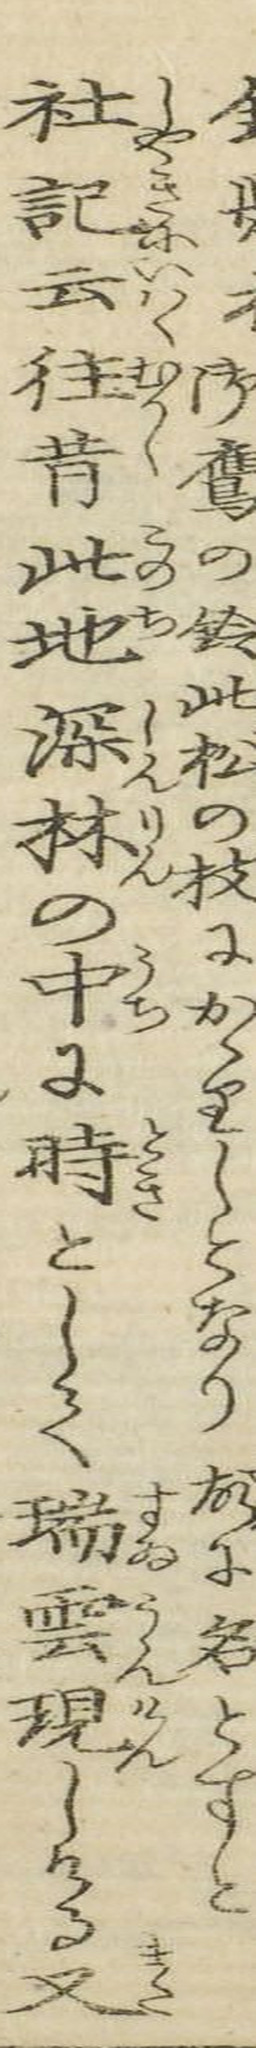社記云往昔此地深林の中に時として瑞雲現しける又
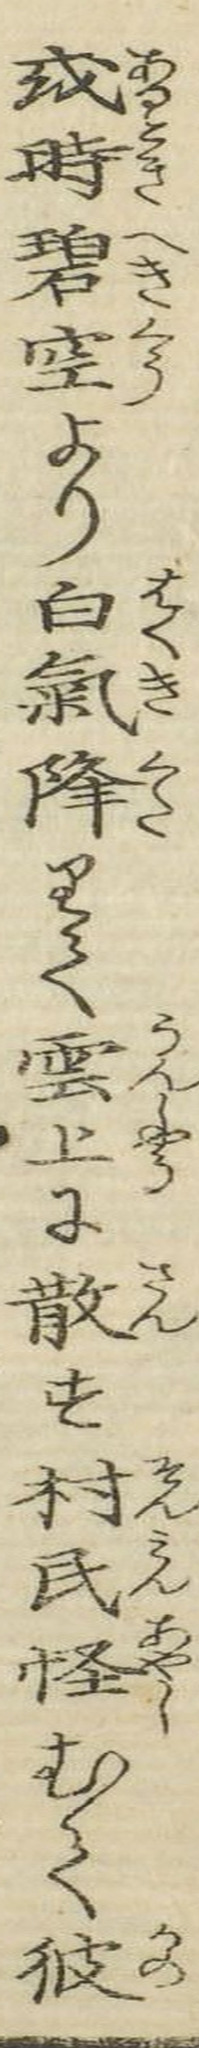或時碧空より白気降りて雲上に散す村民怪むて彼
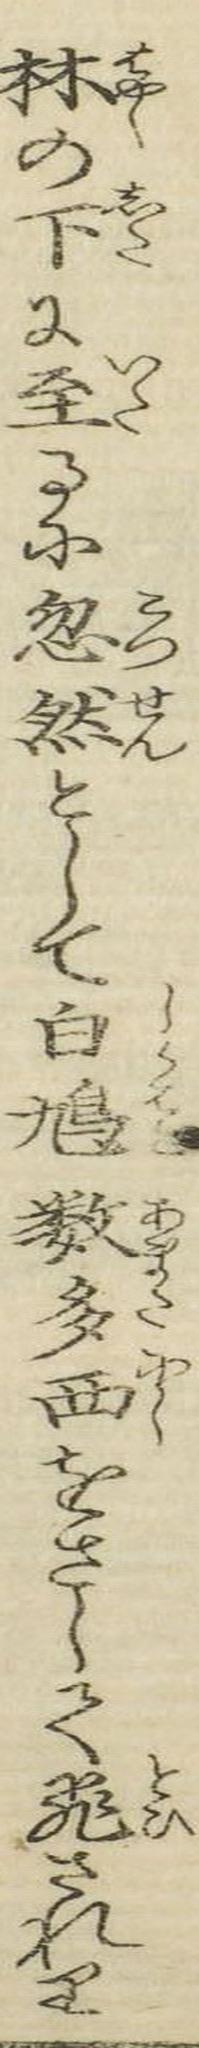林の下に至るに忽然として白鳩数多西をさして飛されり
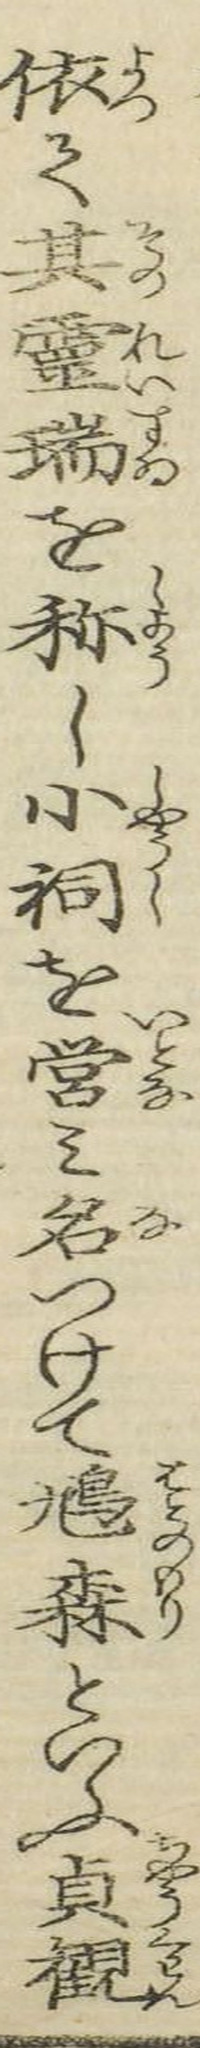依て其霊瑞を称し小祠を営み名つけて鳩森といふ貞観
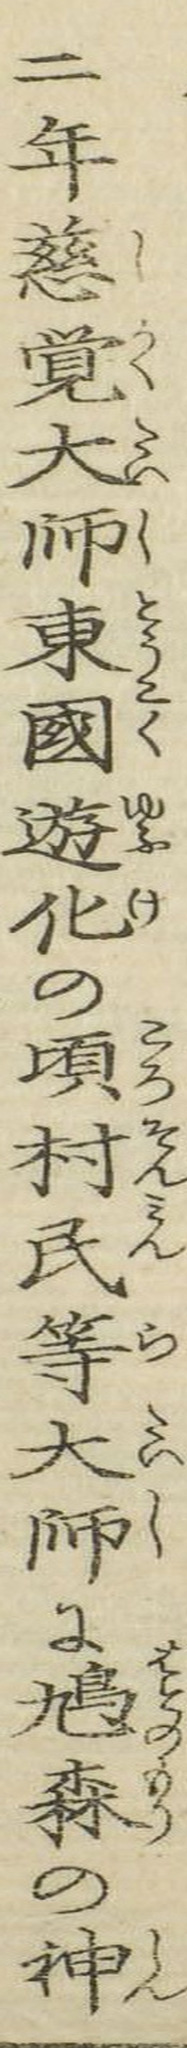二年慈覚大師東国遊化の頃村民等大師に鳩森の神
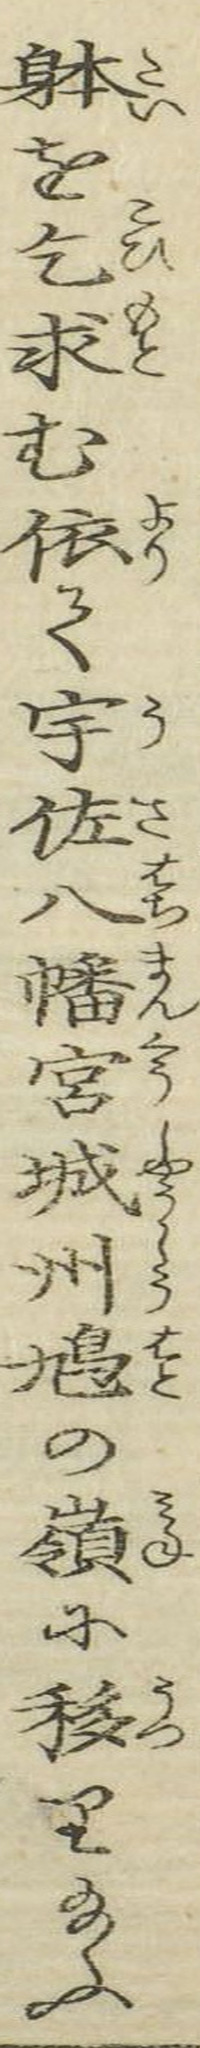躰を乞求む依て宇佐八幡宮城州鳩の嶺に移り給ふ
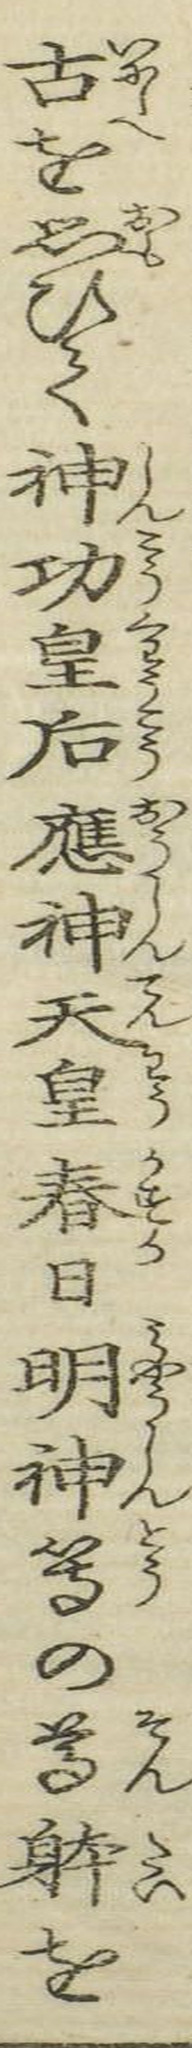古を思ひて神功皇后応神天皇春日明神等の尊躰を
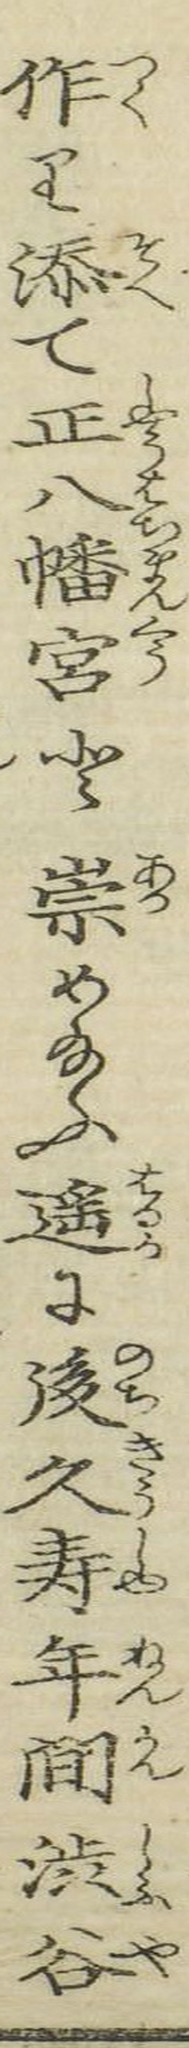作り添て正八幡宮と崇め給ふ遙に後久寿年間渋谷
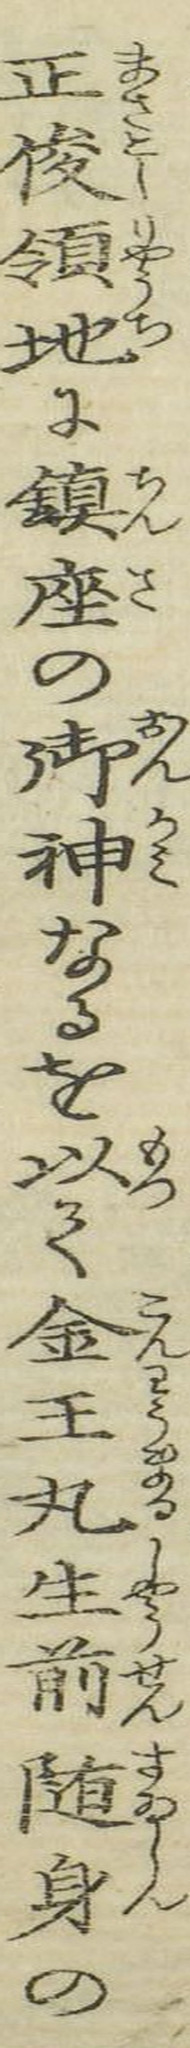正俊領地に鎮座の御神なるを以て金王丸生前随身の
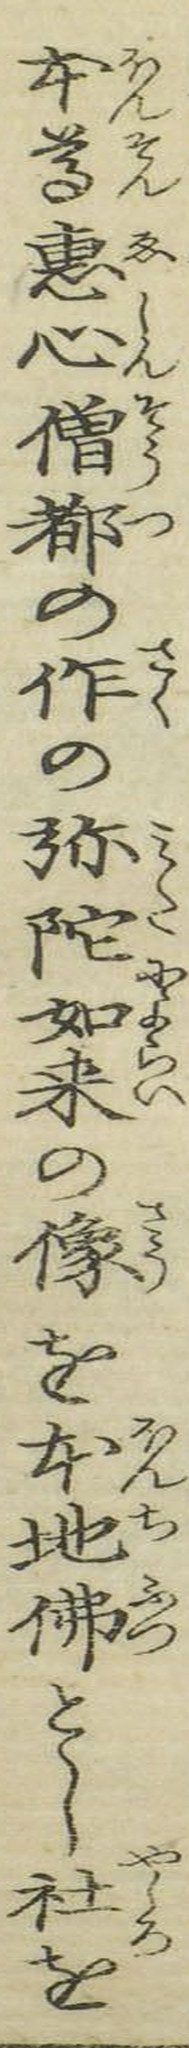本尊恵心僧都の作の弥陀如来の像を本地佛とし社を

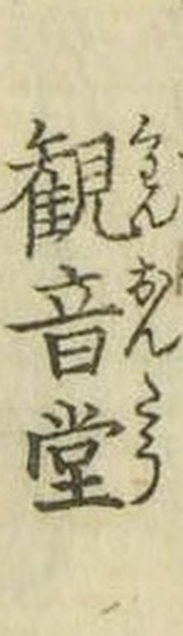観音堂
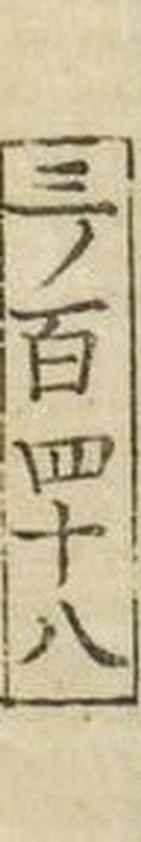三ノ百四十八

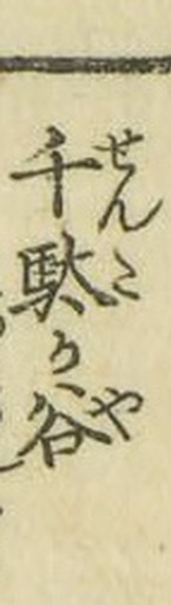千駄か谷
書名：江戸名所図会 20巻 巻之9
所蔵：東京学芸大学教育コンテンツアーカイブ
